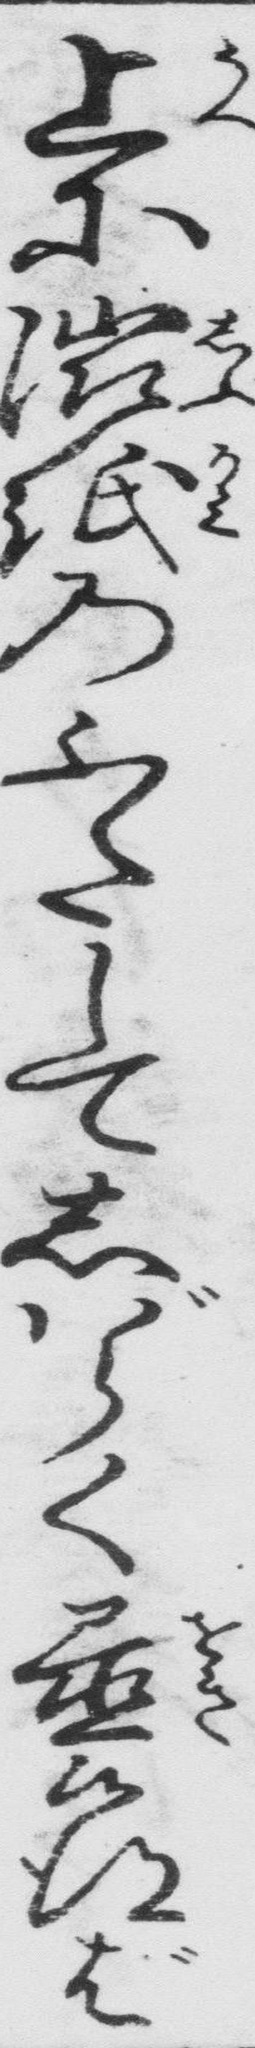上に渋紙のふたしてしばらく置候得ば
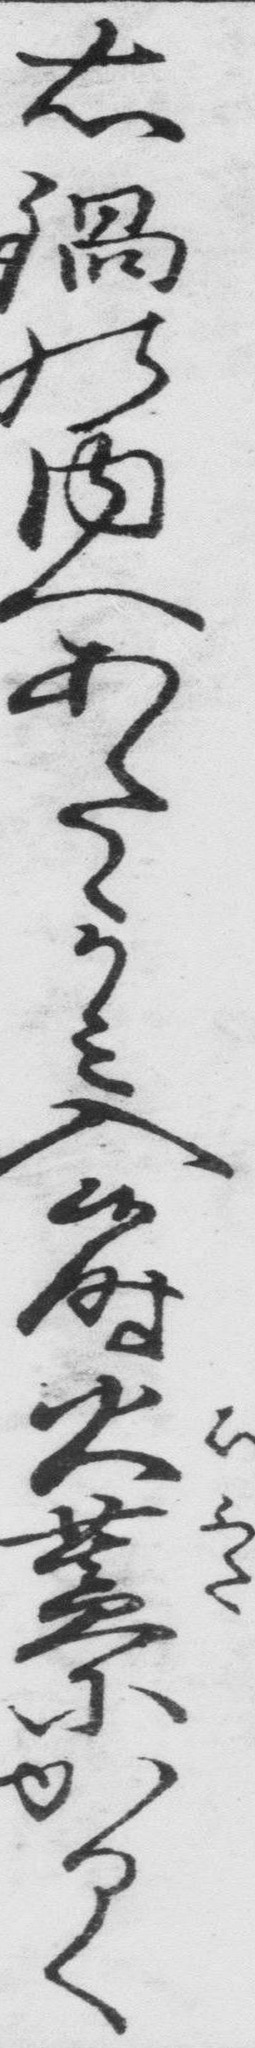右鍋の内へあたゝかみ入候時火蓋にかるく
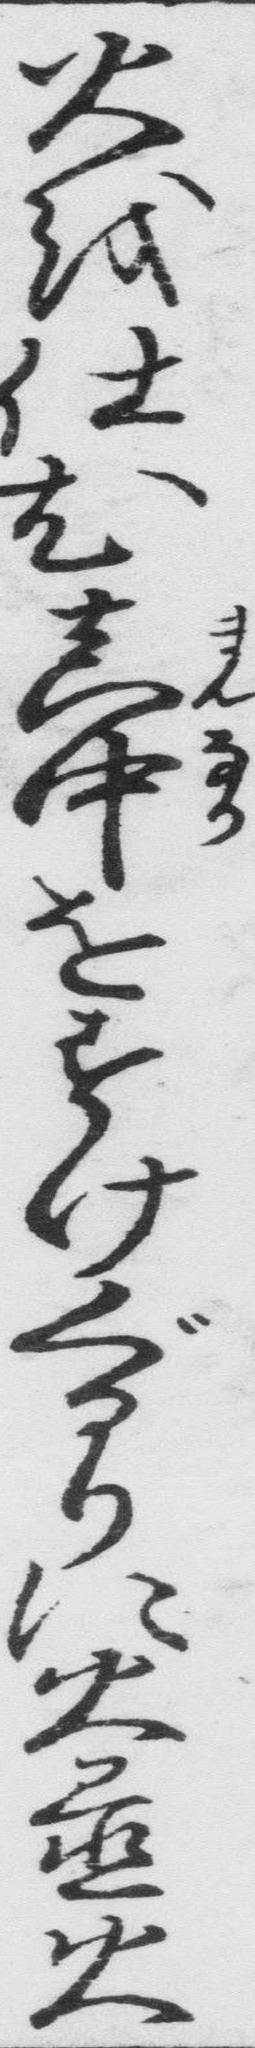火を仕尤真中をさけぐるりに火置火
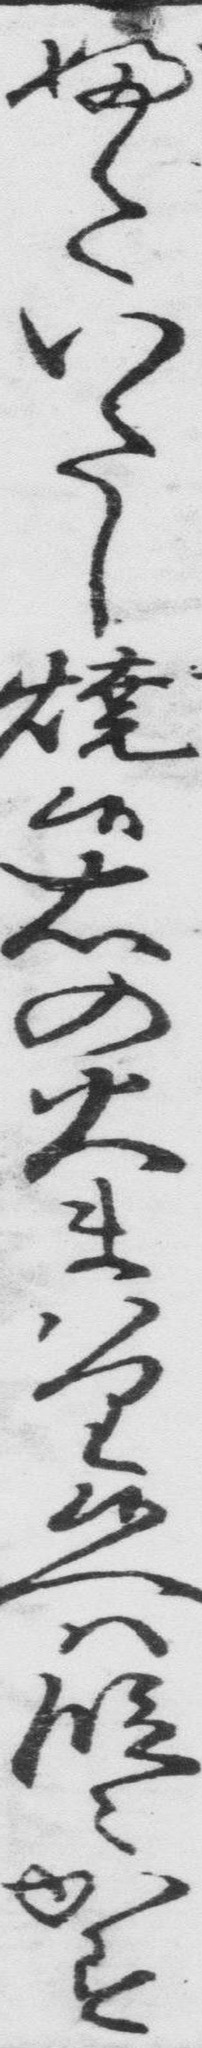ぶたいたし焼候右の火まはり候へは段々かす
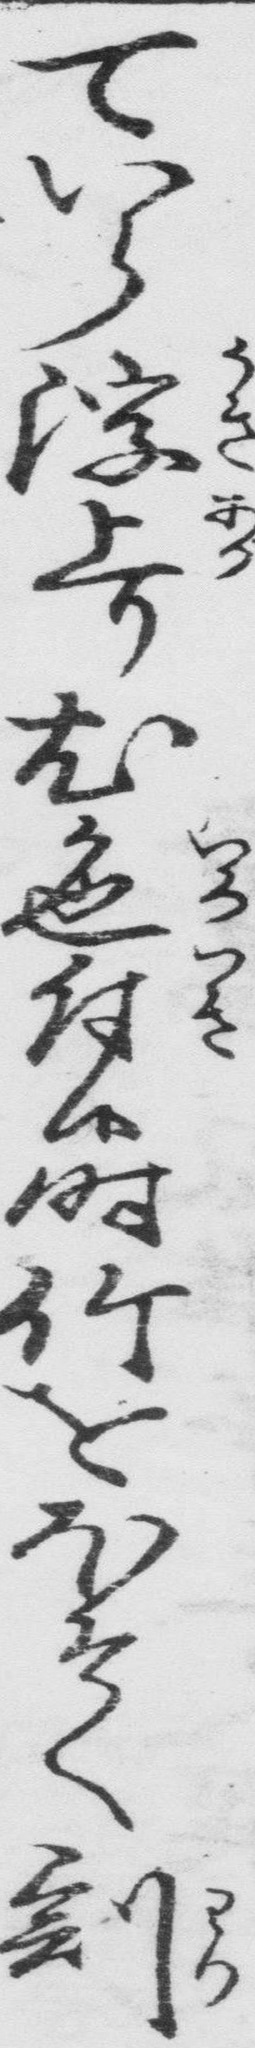ていら浮上り尤色付候時竹をほそく割
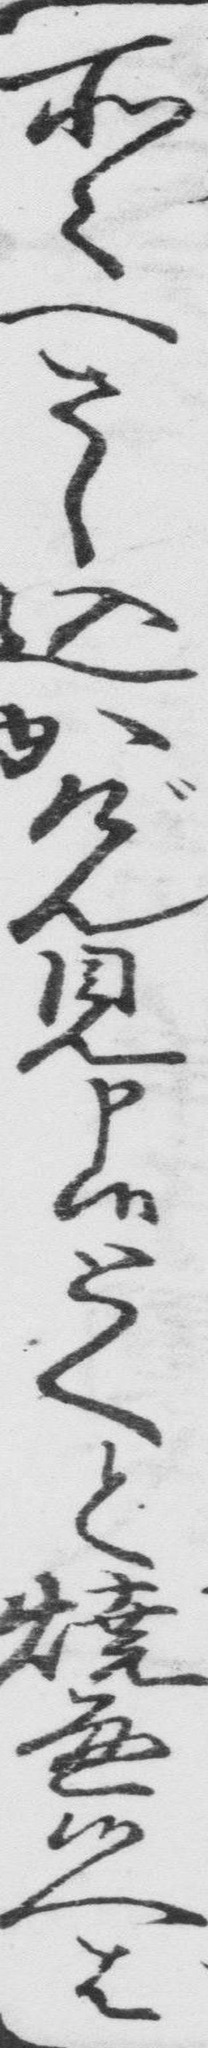所々へさし込かげん見申候とくと焼通候へば
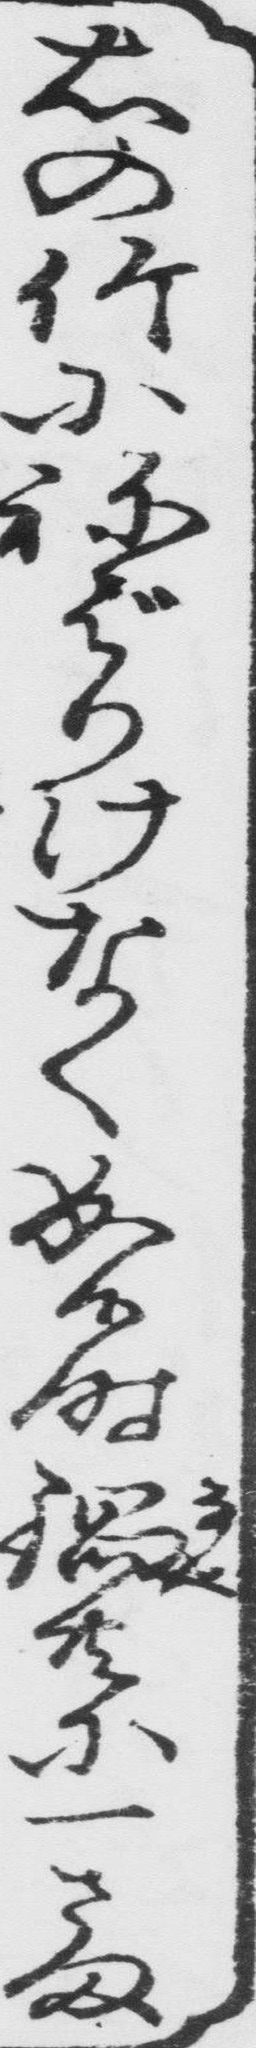右の竹にねばりけなく成候時鍋共に一さま
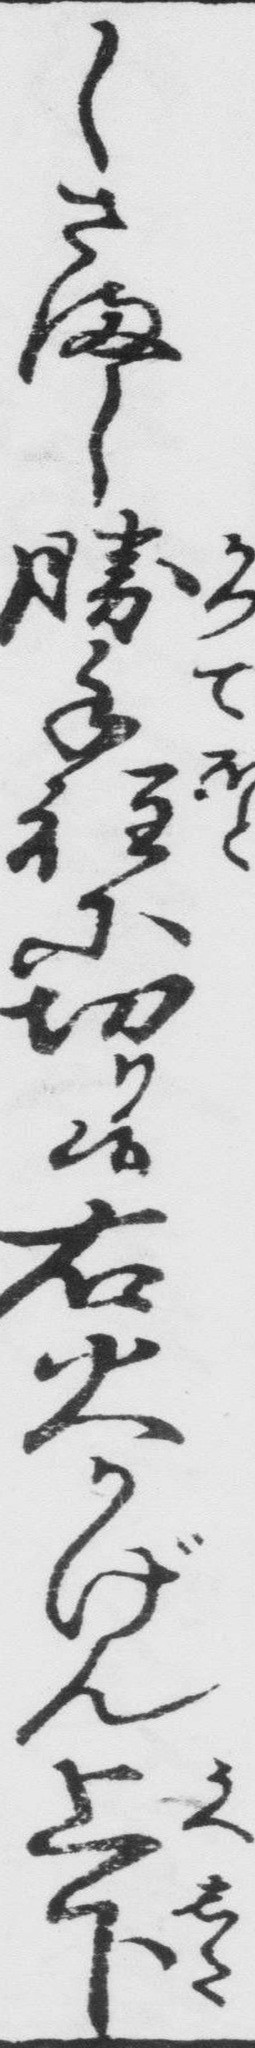しさまし勝手程に切り候右火かげん上下
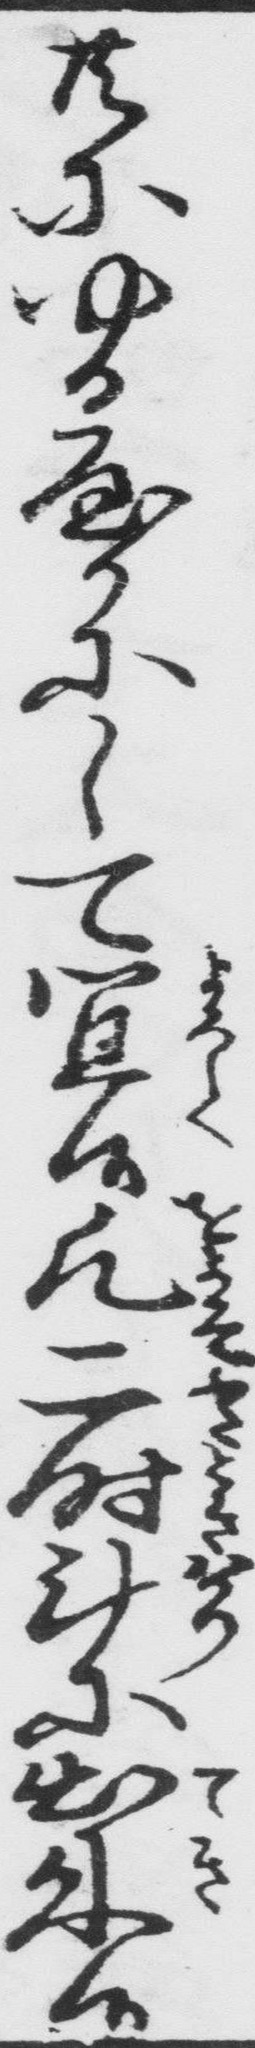共にゆるやかにして宜候凡二時斗に出来候
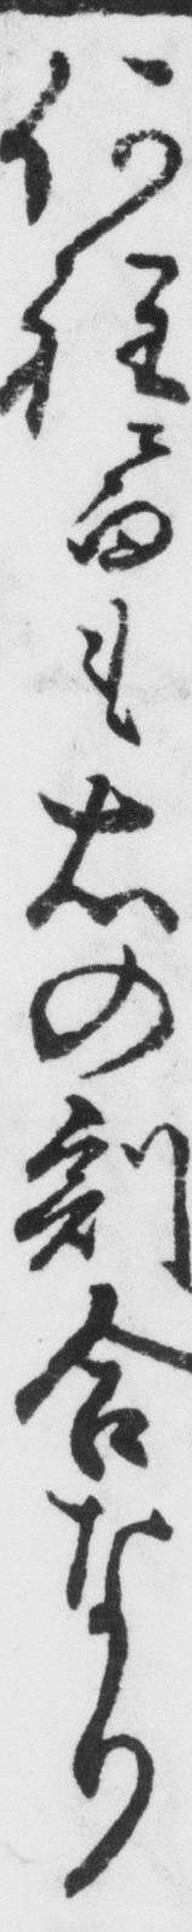何程ニ而も右の割合なり
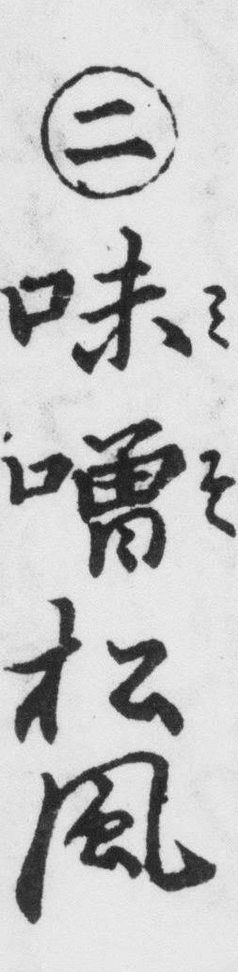(二)味噌松風
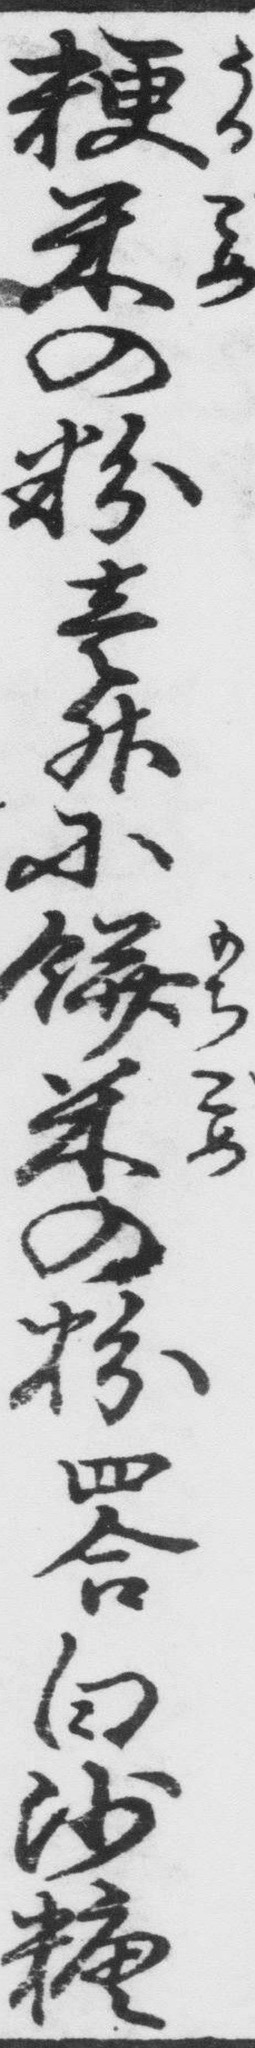粳米の粉壱升に餅米の粉四合白沙糖

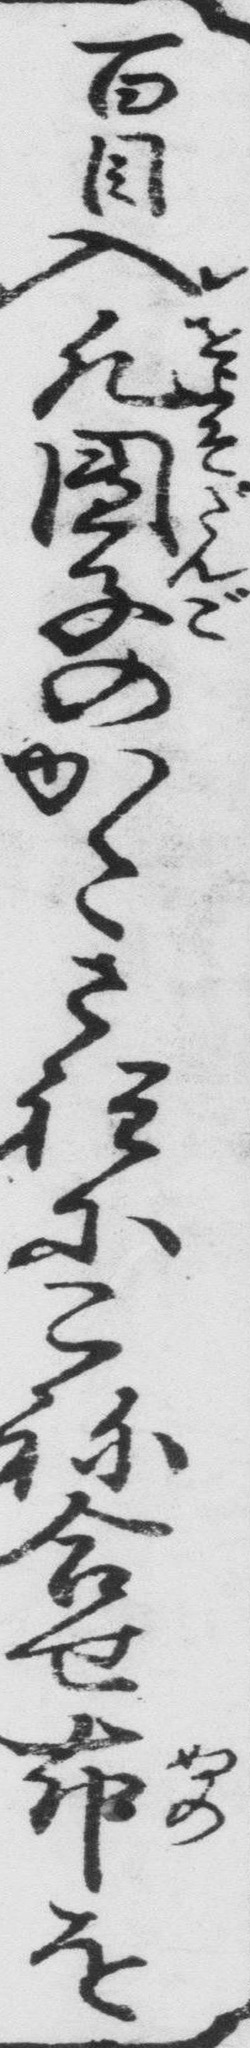百目入れ凡団子のかたさ程にこね合せ布を
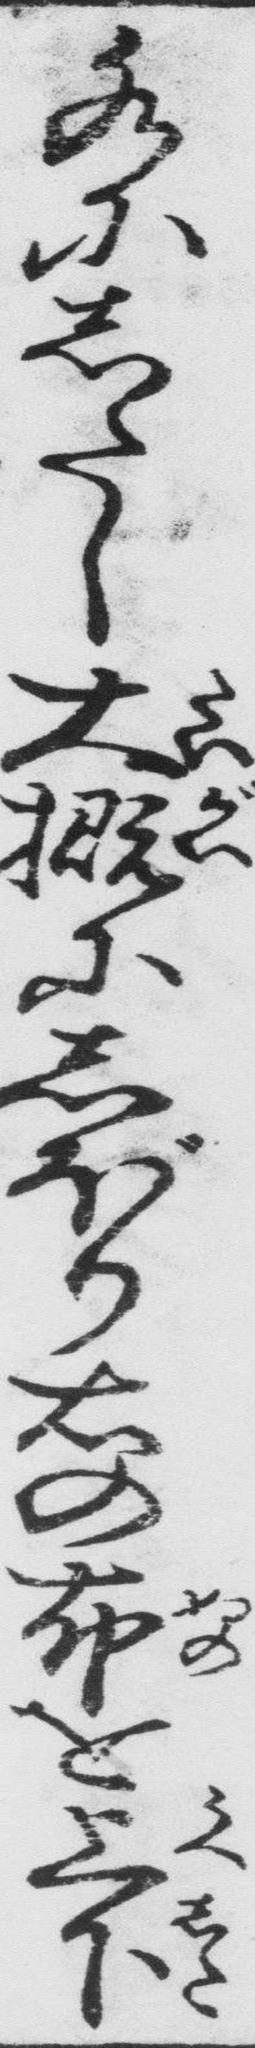水にしたし大概にしぼり右の布を上下
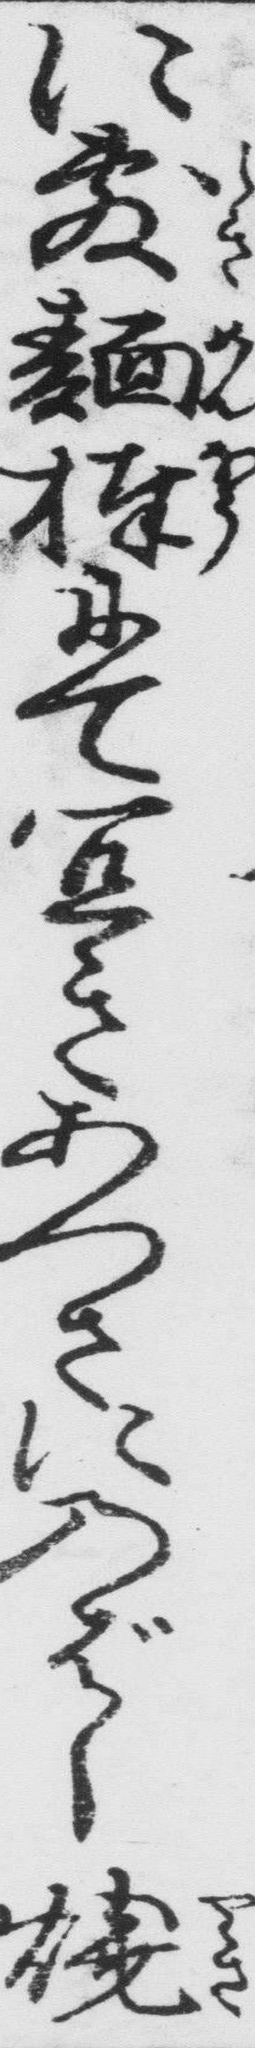に敷麺棒にて宜きあつさにのばし焼
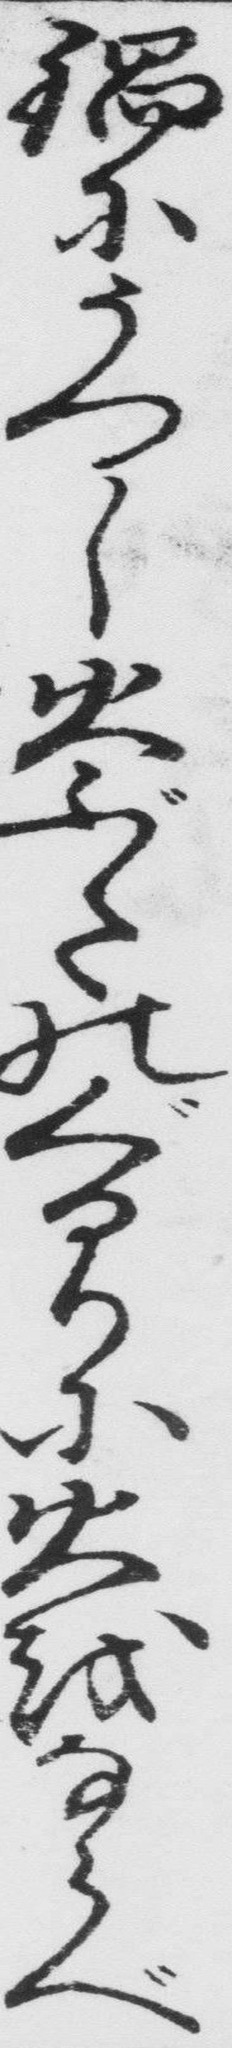鍋にうつし火ぶたのぐるりに火をならべ
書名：御前菓子図式
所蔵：大阪府立大学学術情報センター 国文学研究資料館
